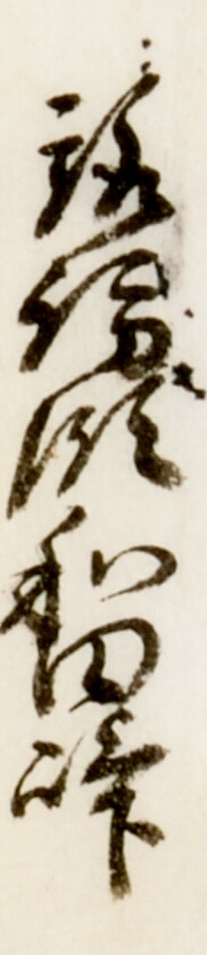諏訪領和田峠
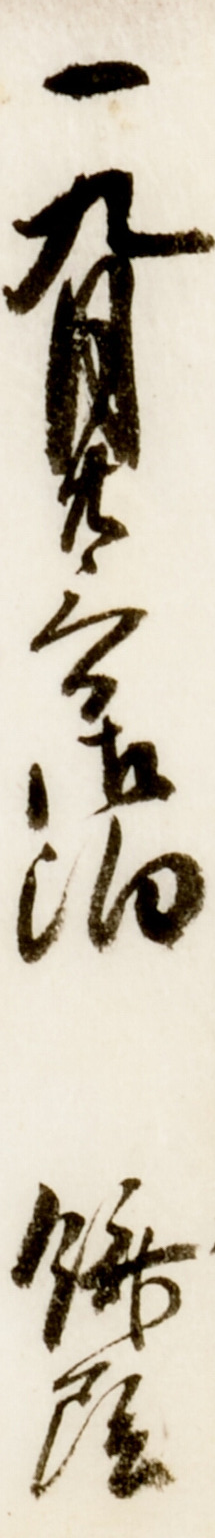一九月廿三日御泊餅屋
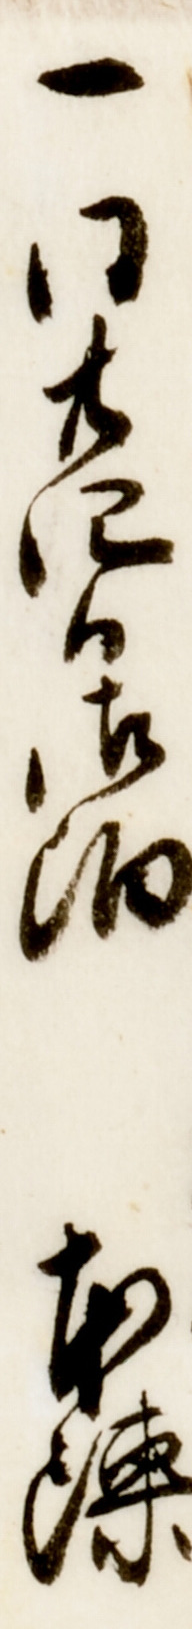一同廿四日御泊本陣
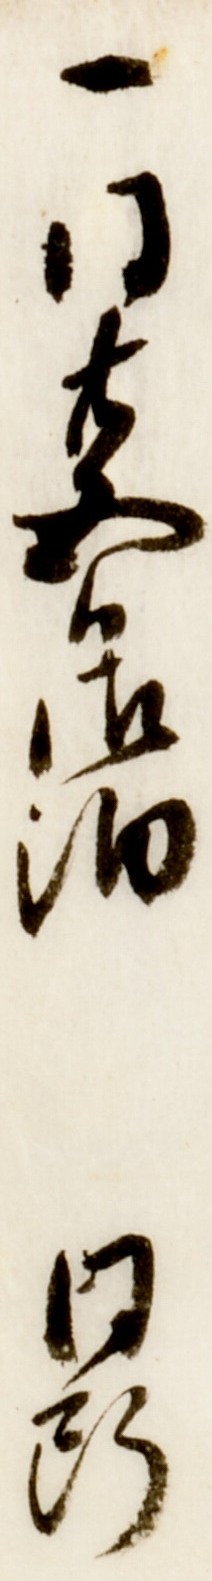一同廿五日御泊同断
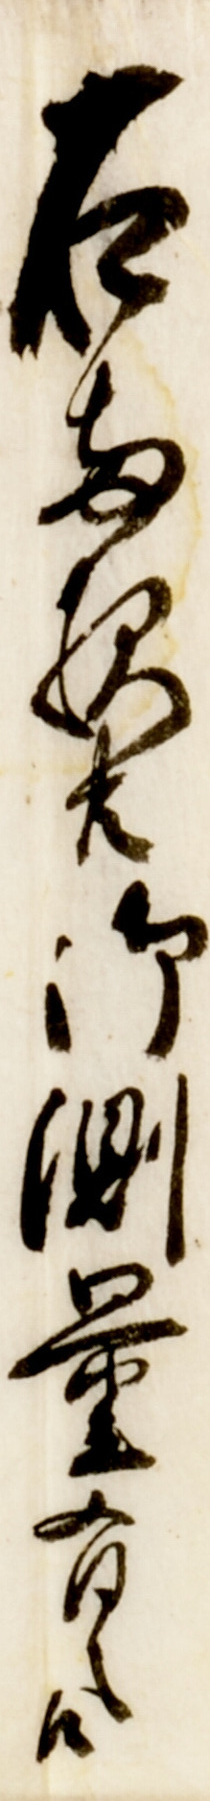右両様共御測量有之候
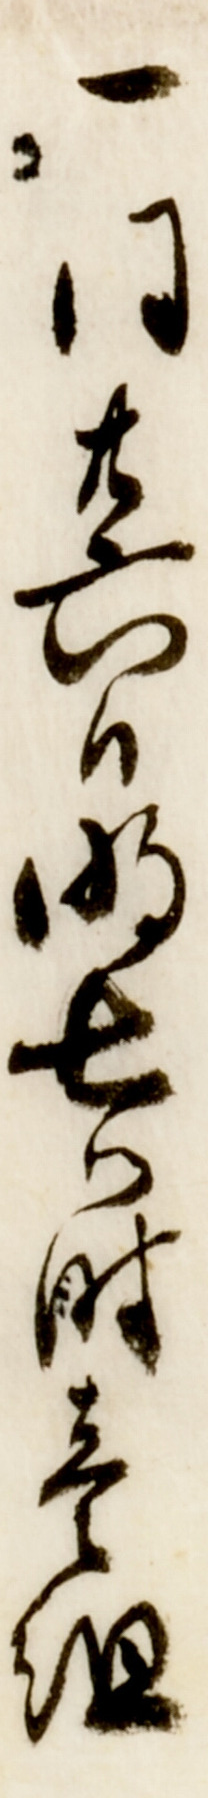一同廿六日明七ツ時壱組
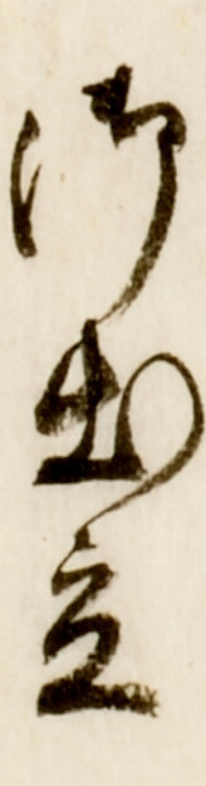御出立
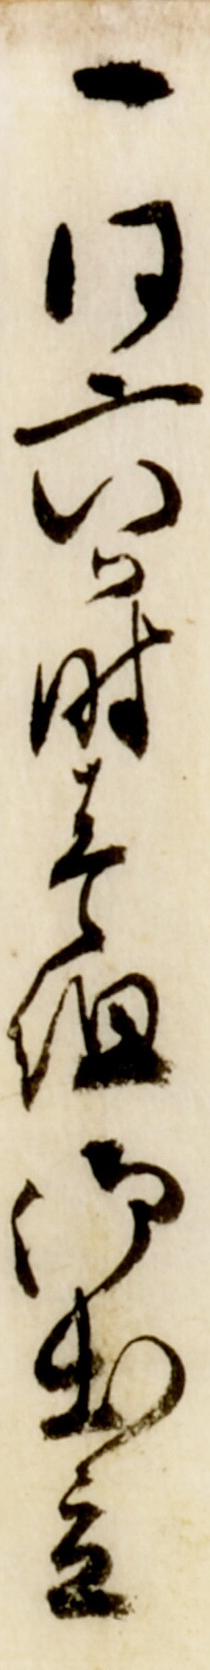一同六ツ時壱組御出立
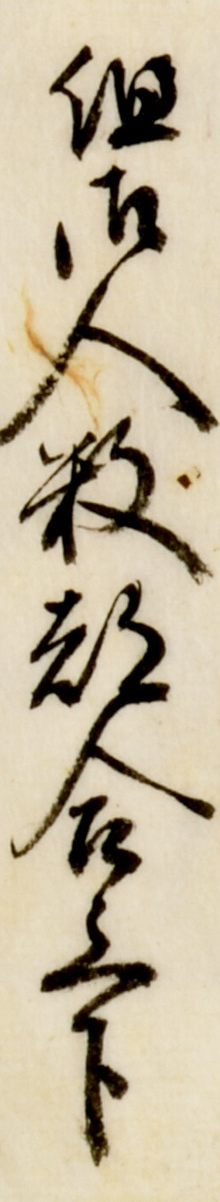但、御人数都合上下
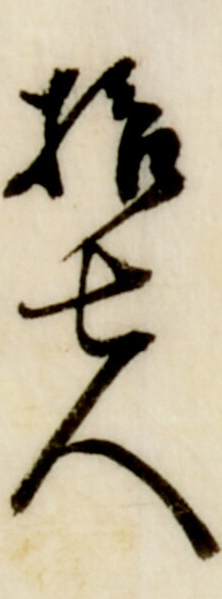拾七人

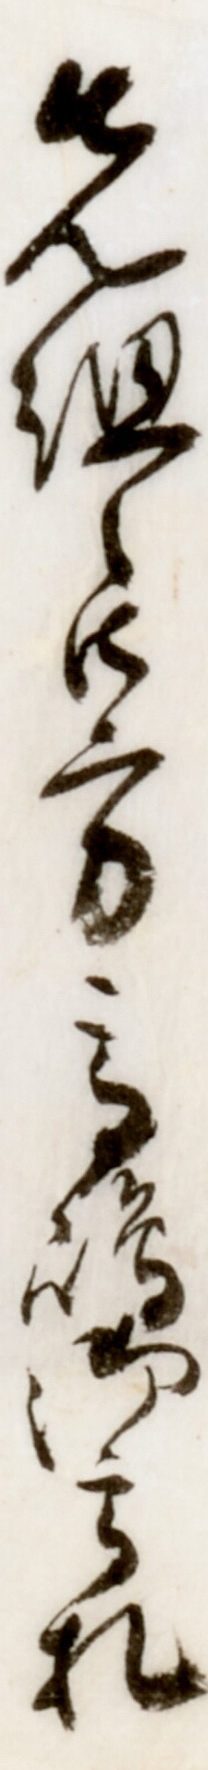先組之御方高嶋御高札
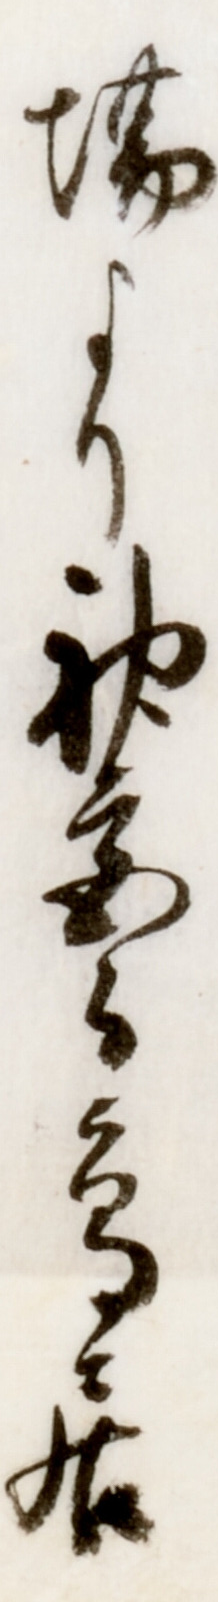場より神宮寺鳥居
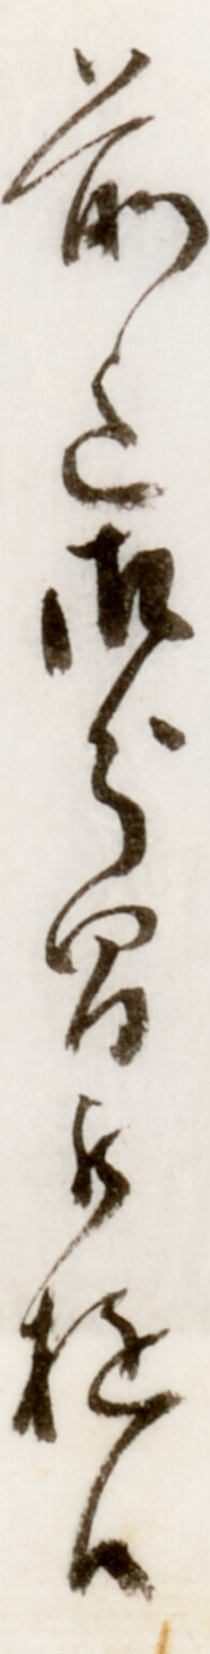前迄御分間被遊候
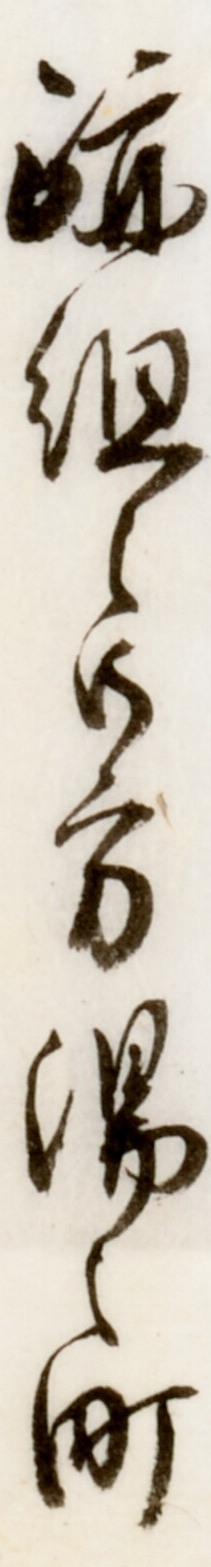跡組之御方湯之町
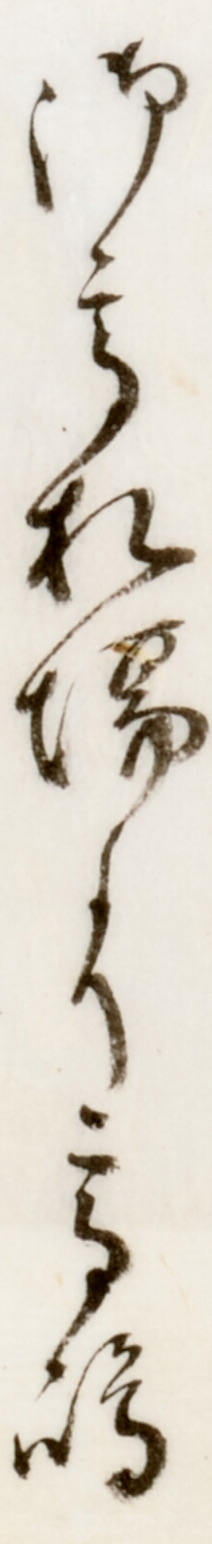御高札場より高嶋
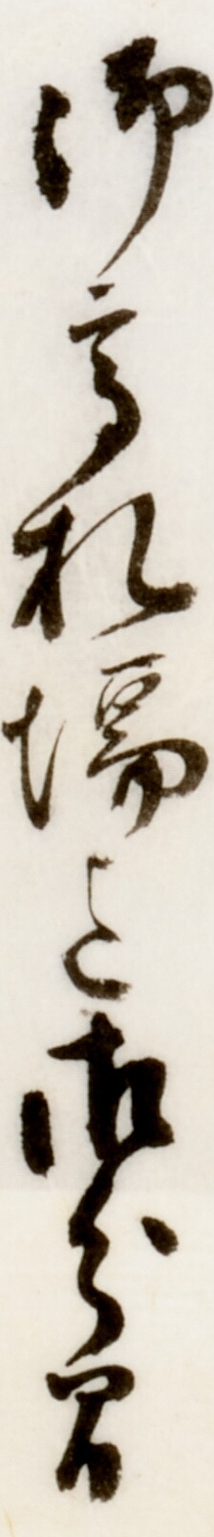御高札場迄御分間
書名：覚
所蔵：伊那市立高遠町図書館・合同会社AMANE
